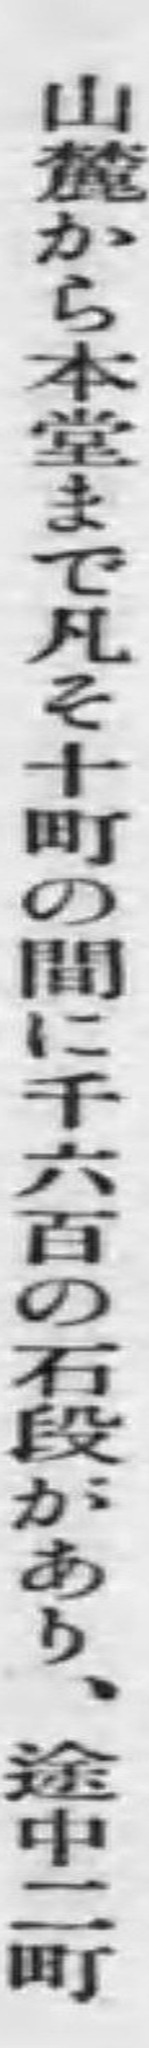山麓から本堂まで凡そ十町の間に千六百の石段があり、途中二町
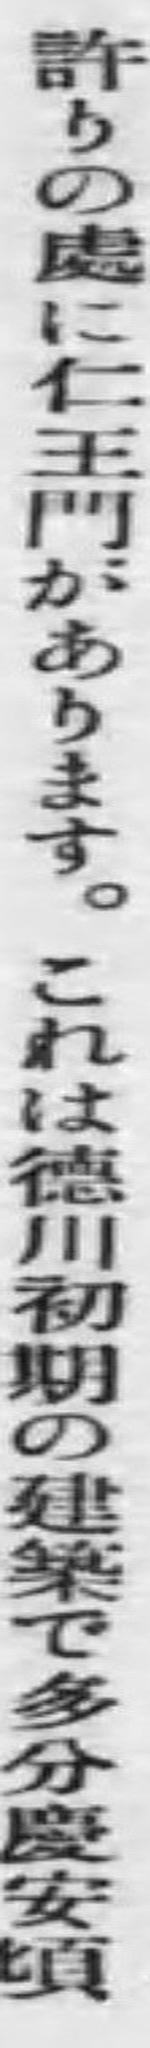許りの處に仁王門があります。これは徳川初期の建築で多分慶安頃
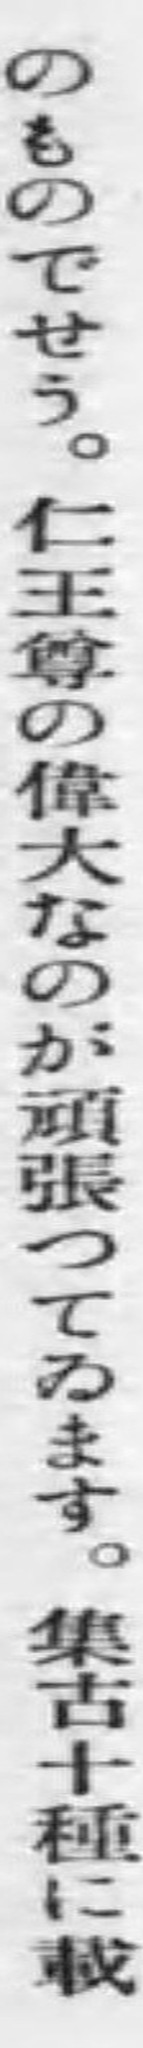のものでせう。仁王尊の偉大なのが頑張つてゐます。集古十種に載
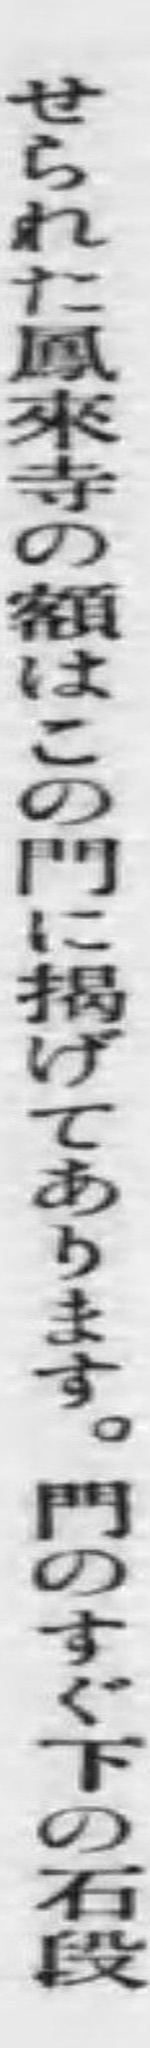せられた鳳來寺の額はこの門に掲げてあります。門のすぐ下の石段
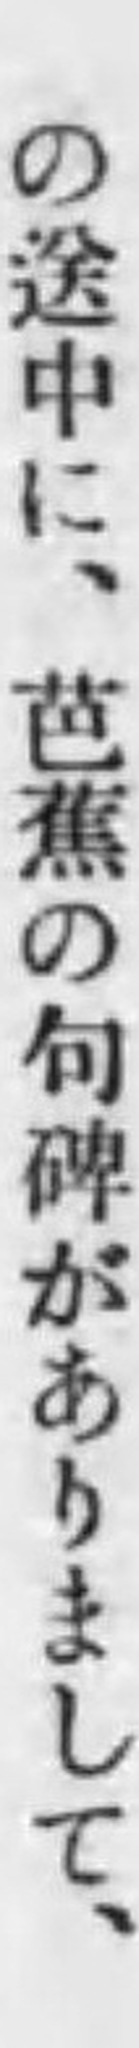の送中に、芭蕉の句碑がありまして、
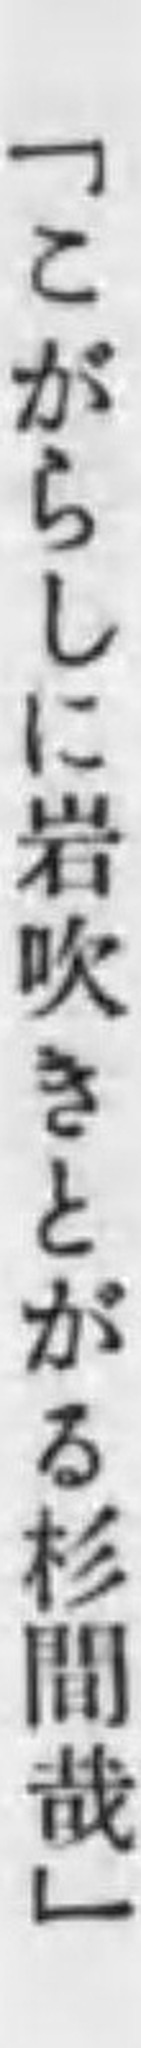「こがらしに岩吹きとがる杉間哉」
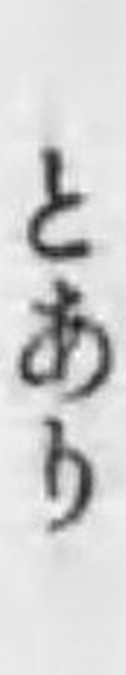とあり
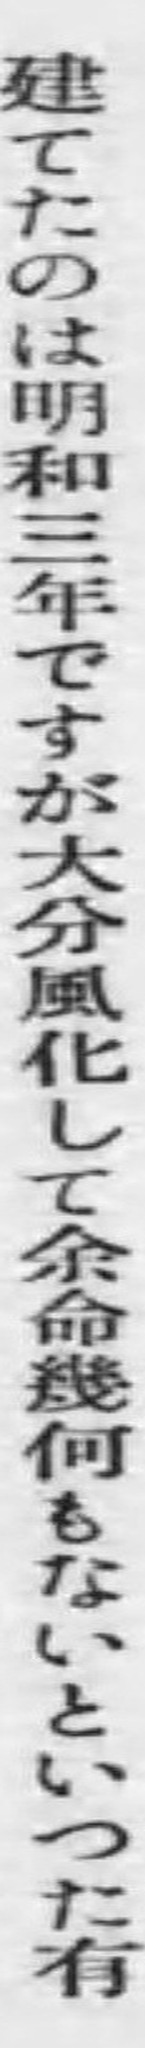建てたのは明和三年ですが大分風化して余命幾何もないといつた有
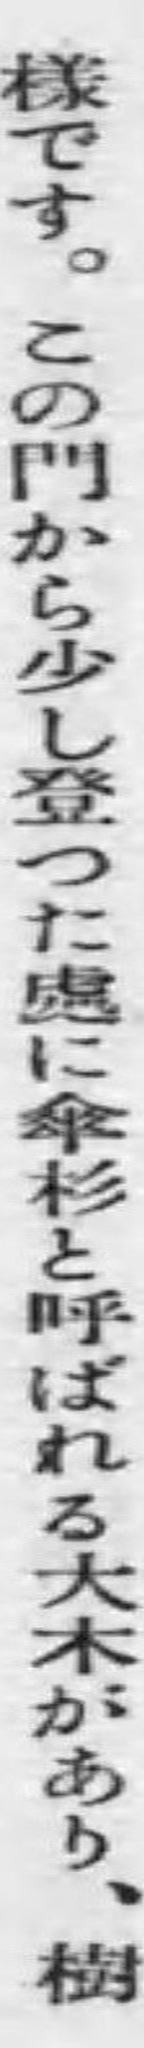様です。この門から少し登つた處に傘杉と呼ばれる大木があり、樹
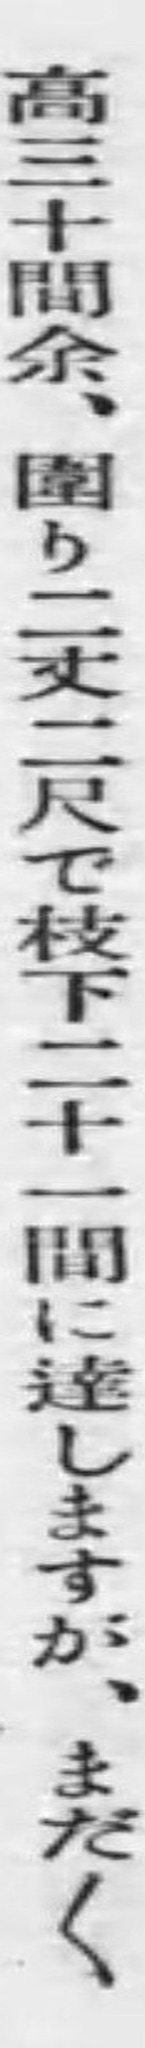高三十間余、圍り二丈二尺で枝下二十一間に達しますが、まだ〳〵
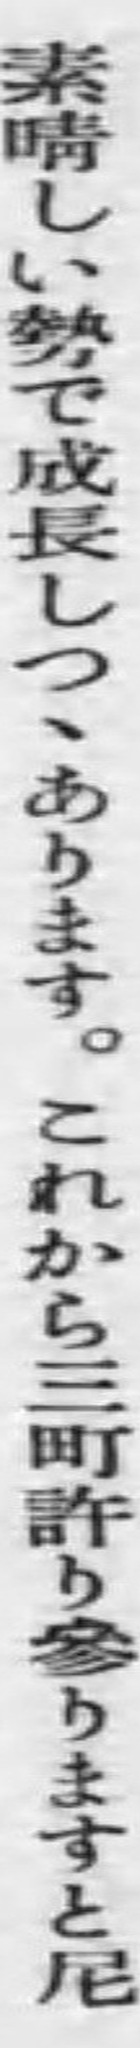素晴しい勢で成長しつヽあります。これから三町許り参りますと尼
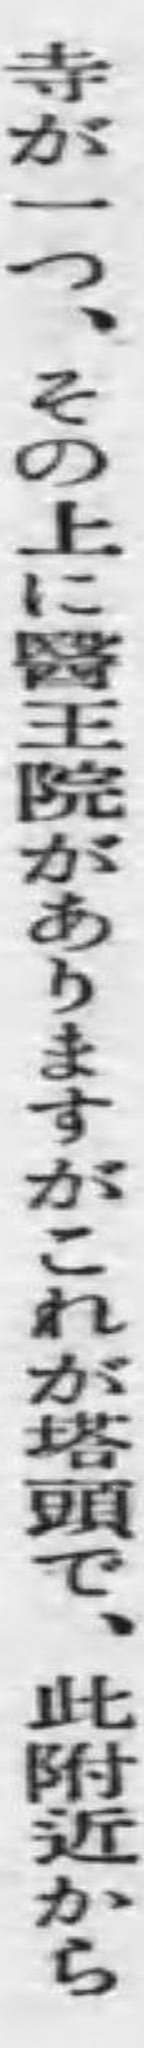寺が一つ、その上に醫王院がありますがこれが塔頭で、此附近から
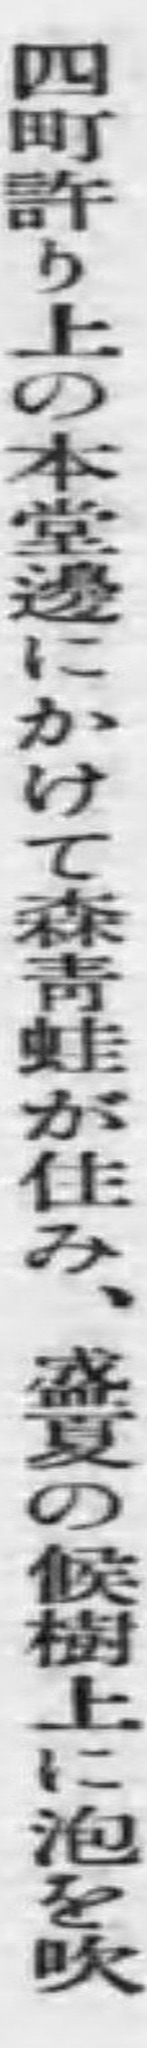四町許り上の本堂邊にかけて森青蛙が住み、盛夏の候樹上に泡を吹
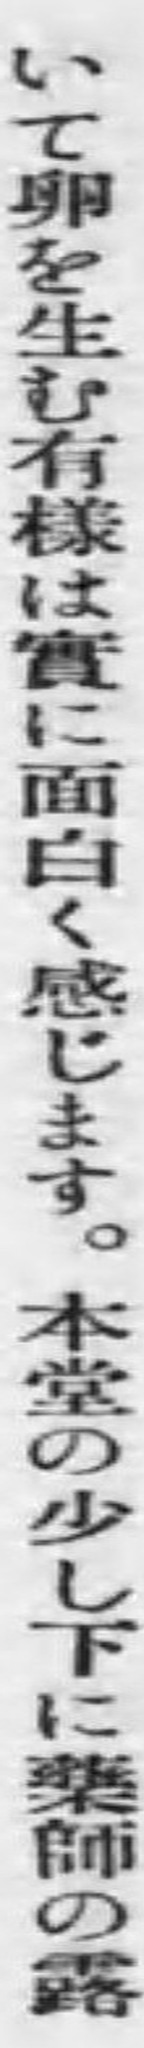いて卵を生む有様は實に面白く感じます。本堂の少し下に藥師の露

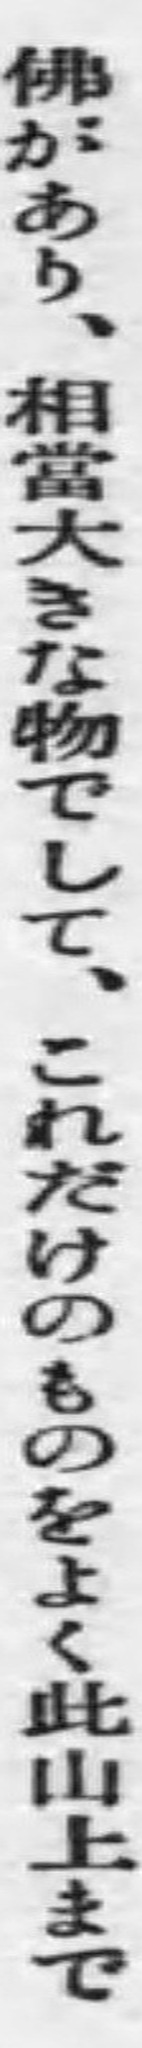佛があり、相當大きな物でして、これだけのものをよく此山上まで
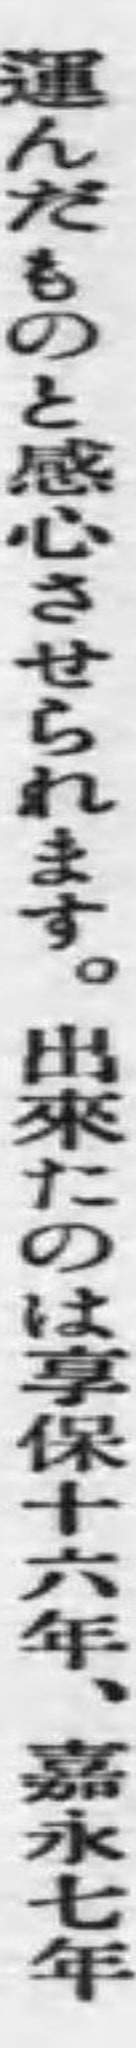運んだものと感心させられます。出來たのは享保十六年、嘉永七年
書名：東三河道中記 : 豊橋市及其附近案内
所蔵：国立国会図書館 National Diet Library, JAPAN
